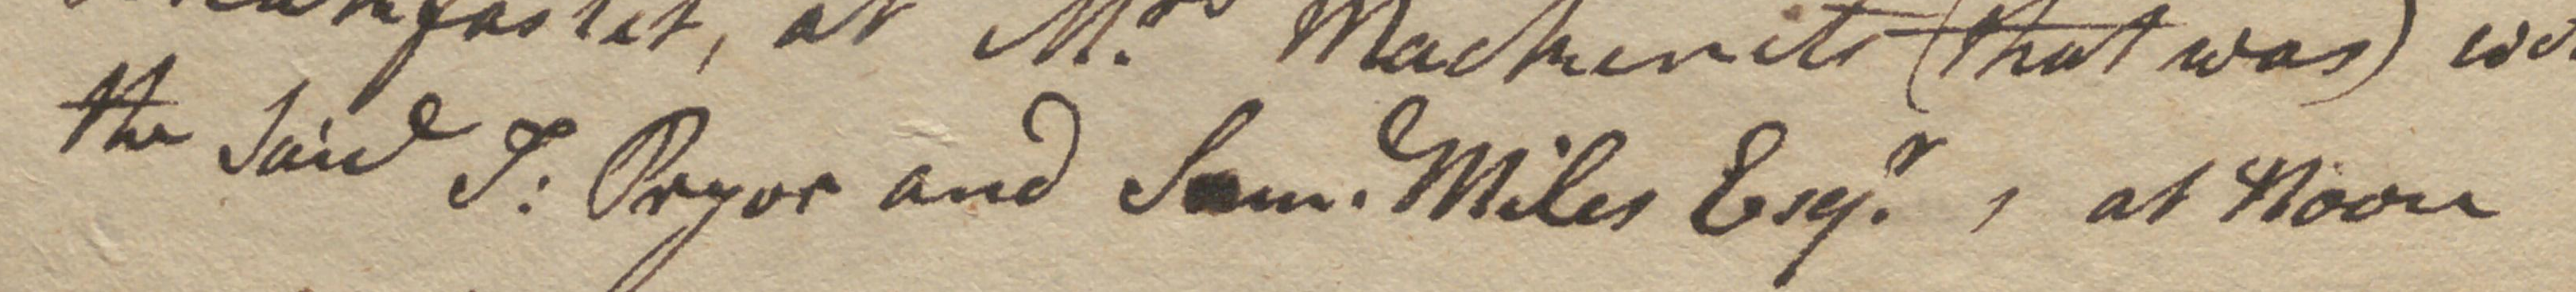the said T: Pryor and Sam^l. Miles Esq^r., at Noon
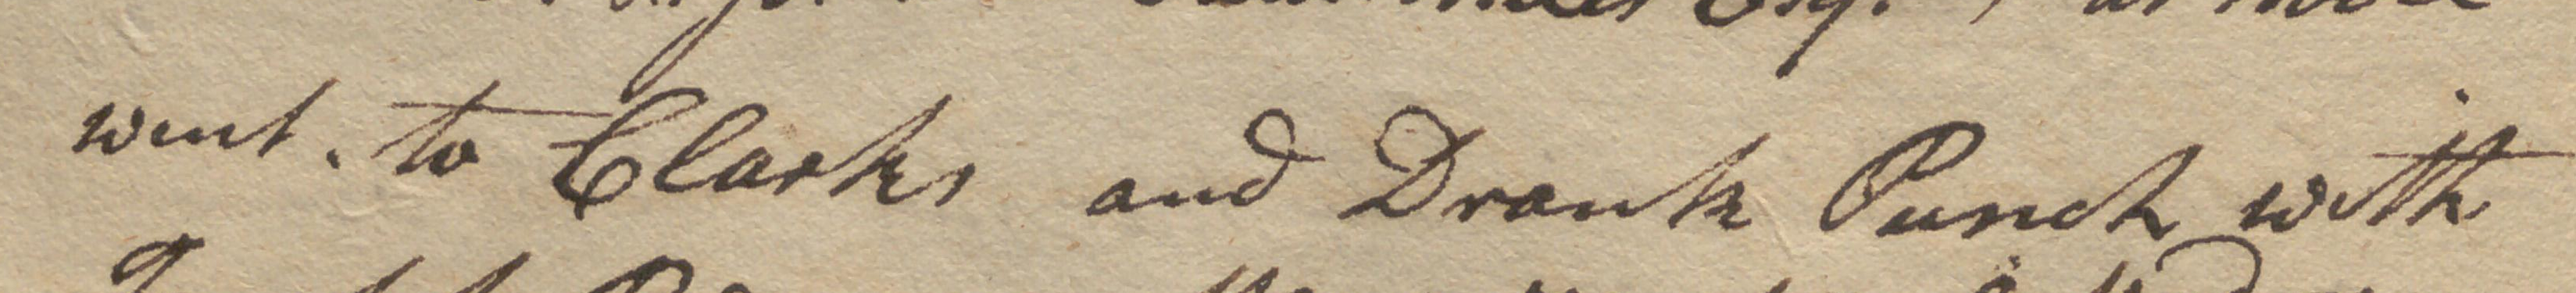went. to Clarks and Drank Punch with
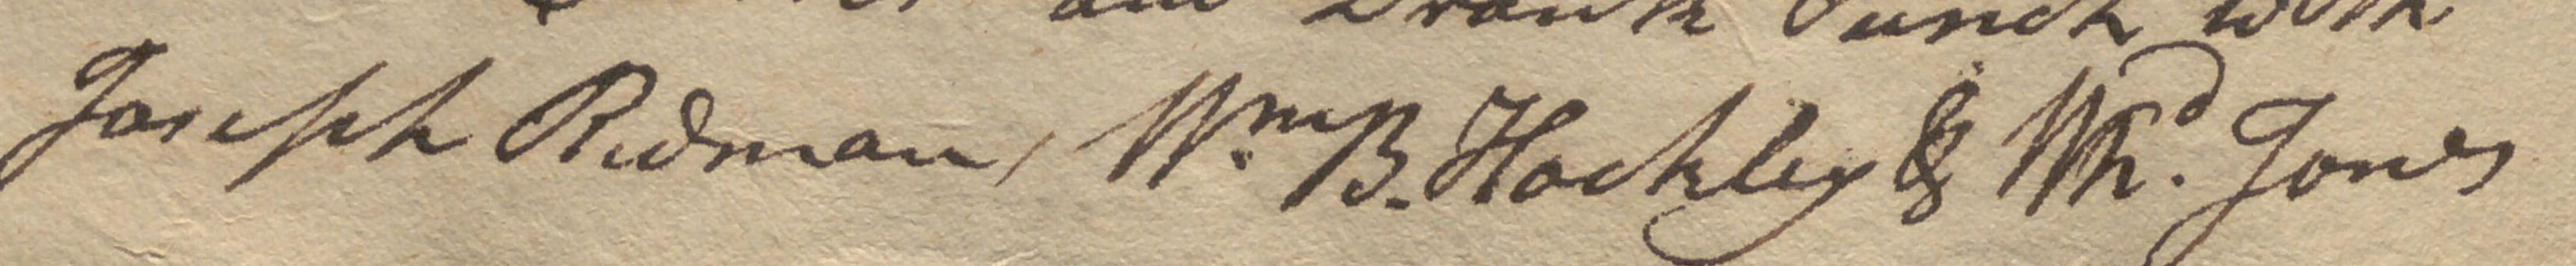Joseph Redman, W^m. B. Hockley & Wh^d. Jones
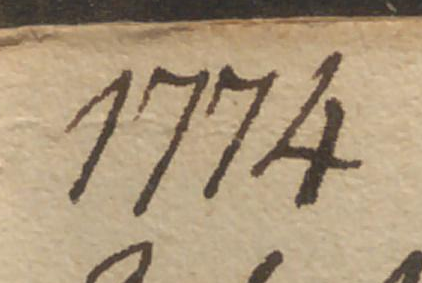1774
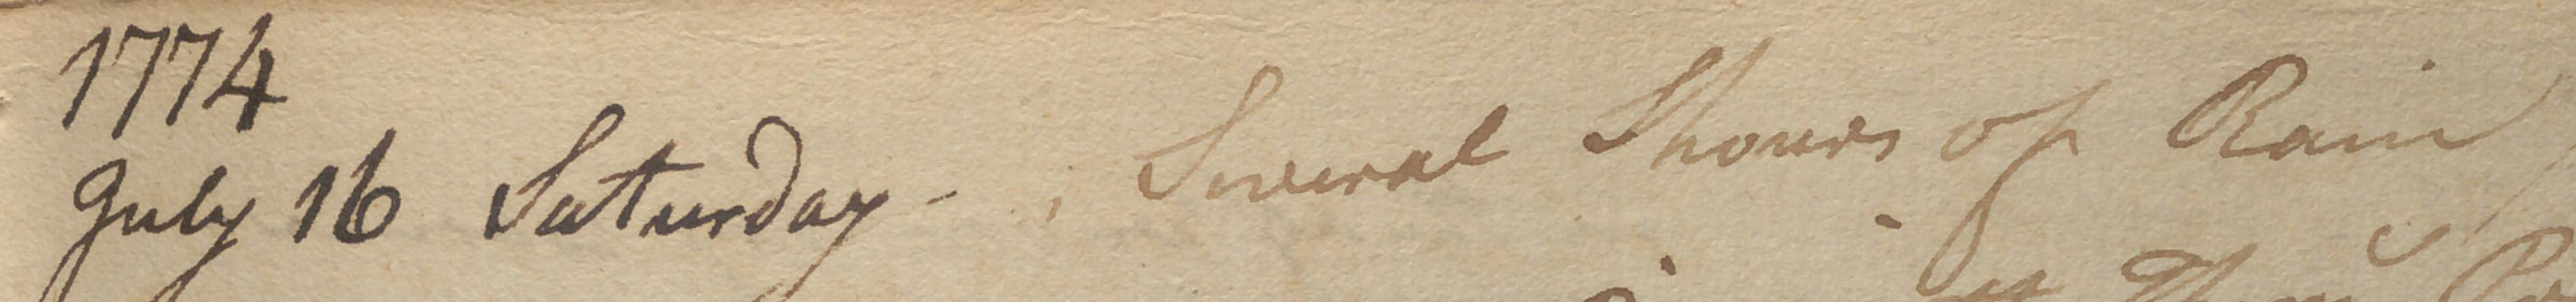July 16 Saturday. Several shours of Rain
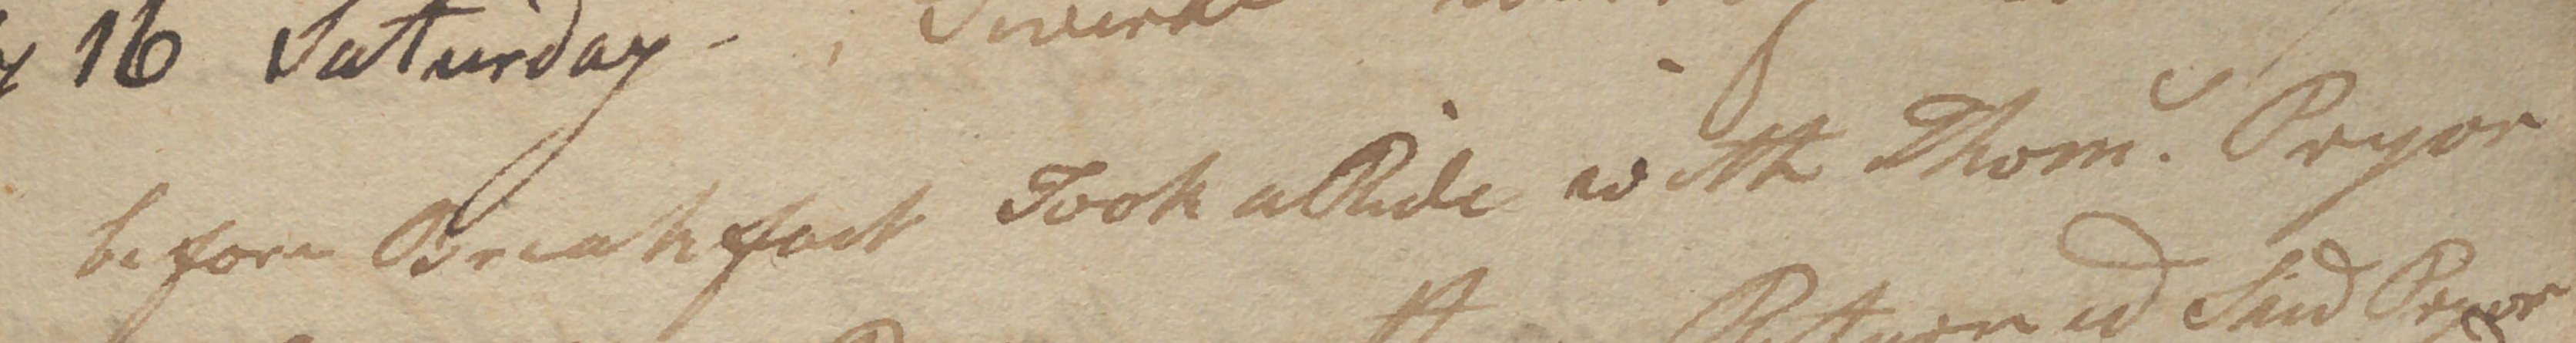before Breakfast Took a Ride with Thom^s. Pryos
